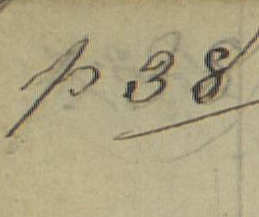p 38
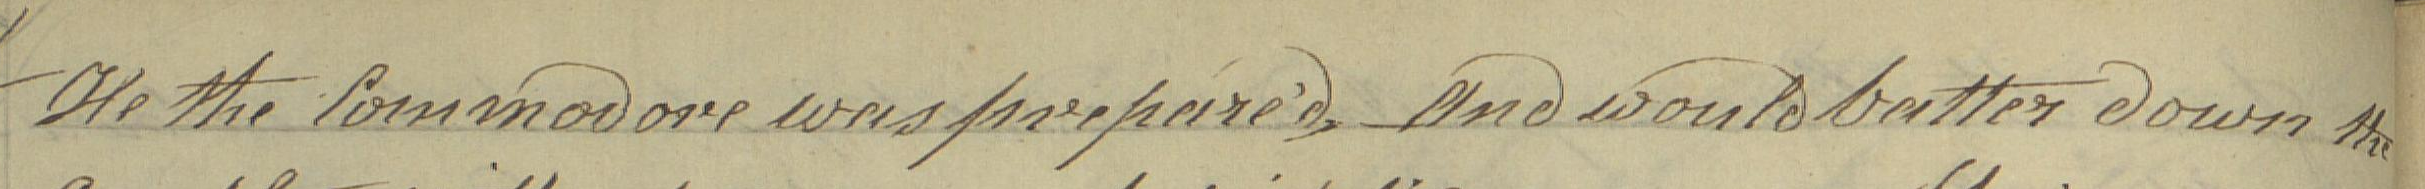He the Commodore was prepared, And would batter down tho
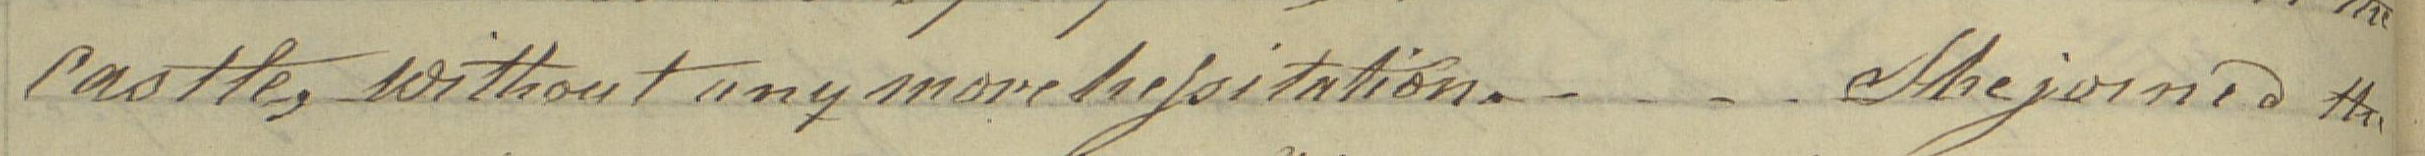castle, without my more hesitation. She joined the
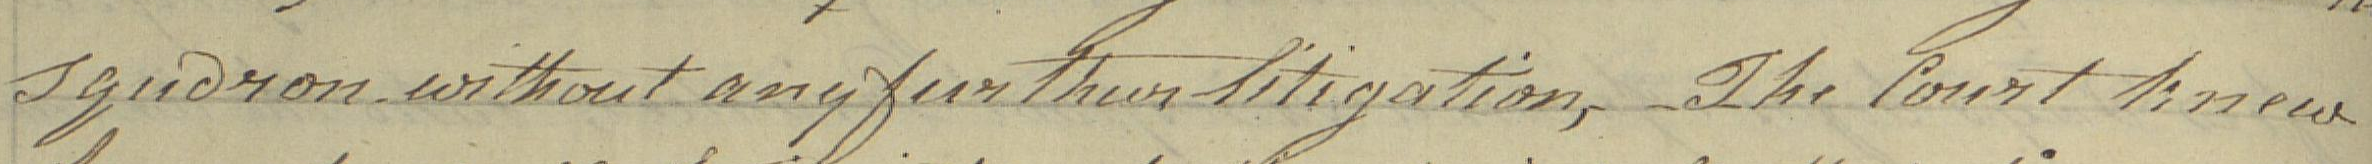squadron without any further litigation-, The Court knew
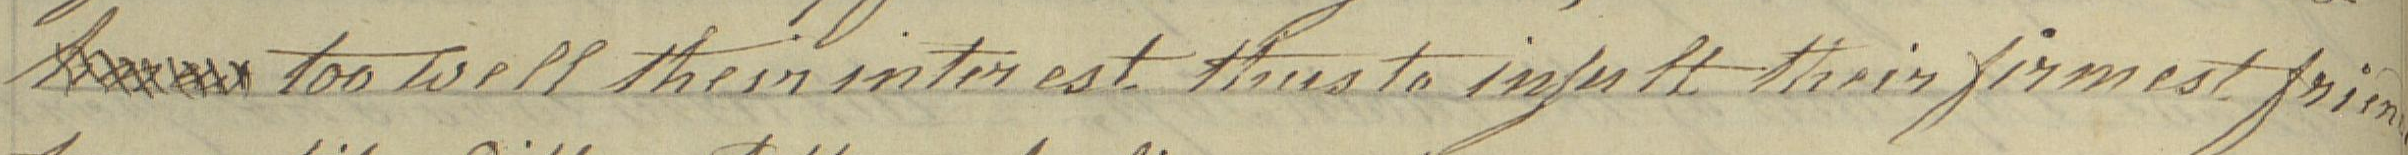know too well their interest thus to insult their firmest fri-
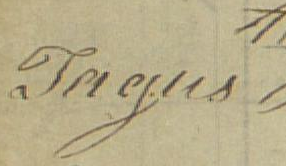Tagus
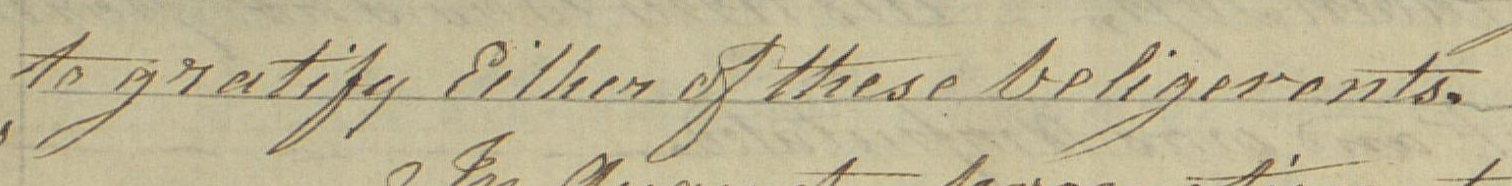to gratify Either of these beligerents.
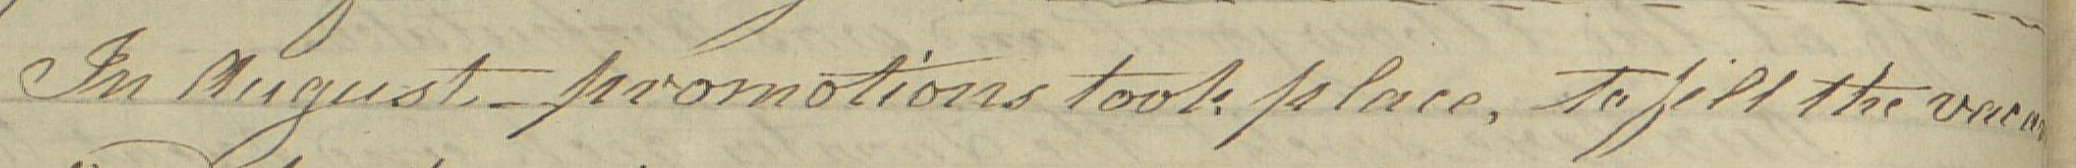In August, promotions took place, to fill the vaca-
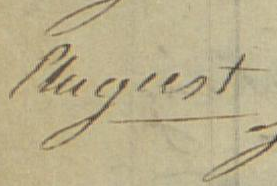August
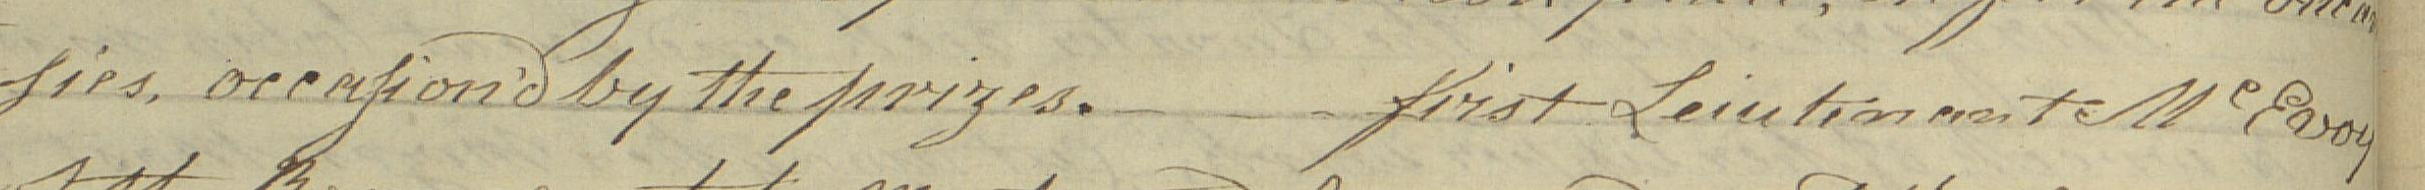fies, occasiond by the prizes. first Leiutenant M^c.Evoy
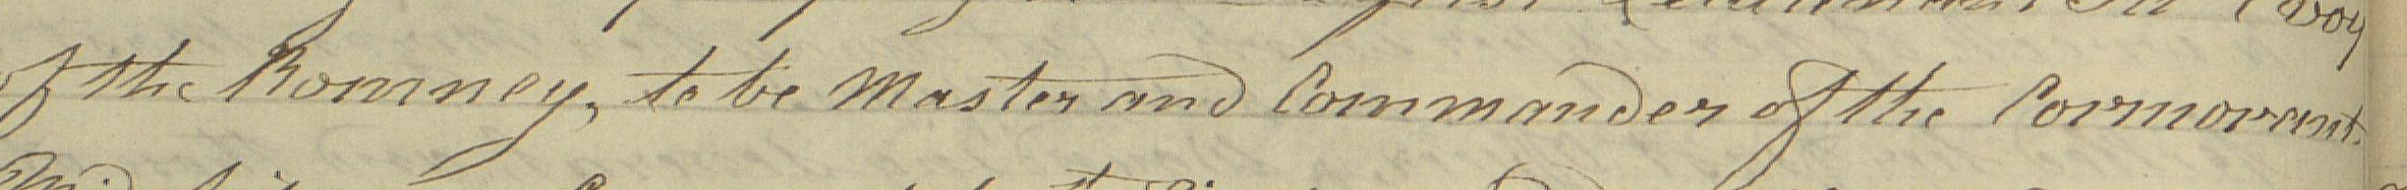of the Romney, to be Master and Commander of the Cormorant
